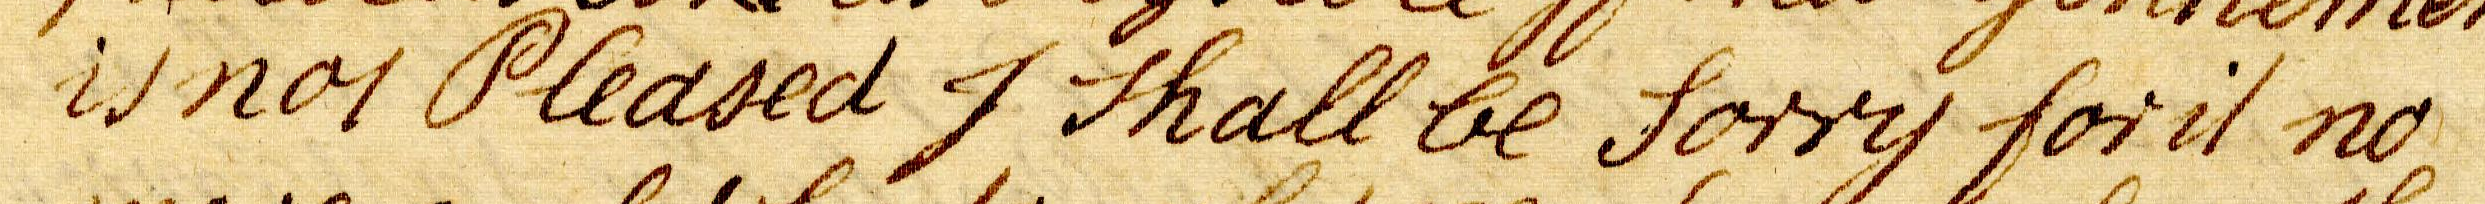is not Pleased I shall be Sorry for it no
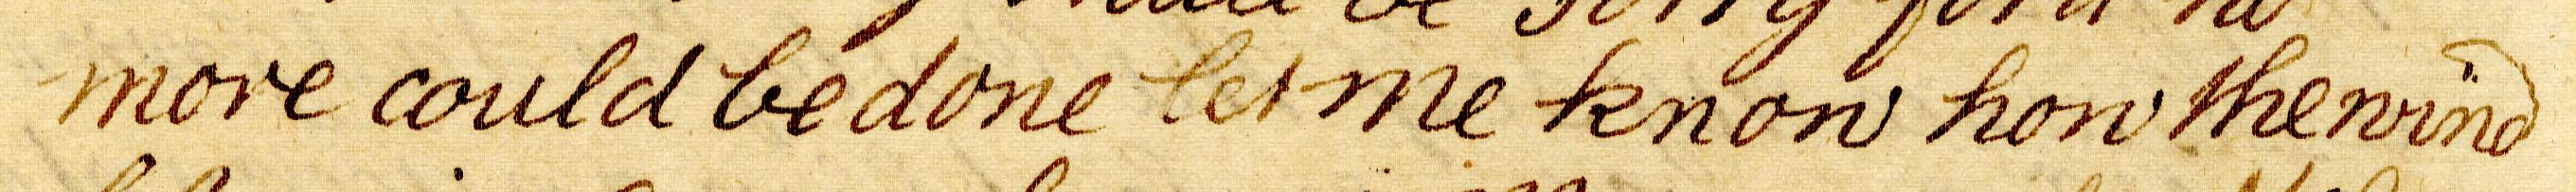more could be done let me know how the wind
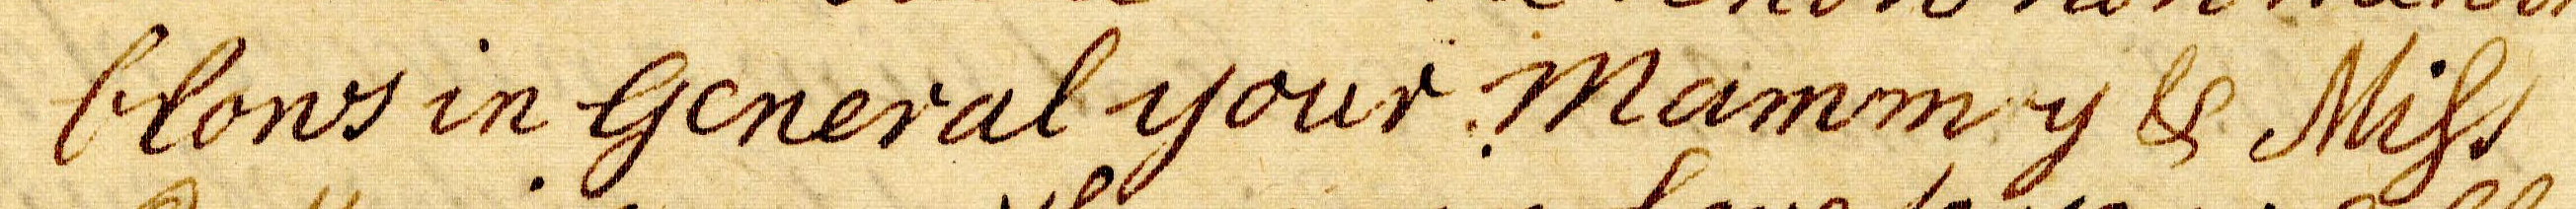blows in General Your Mammy & Mis
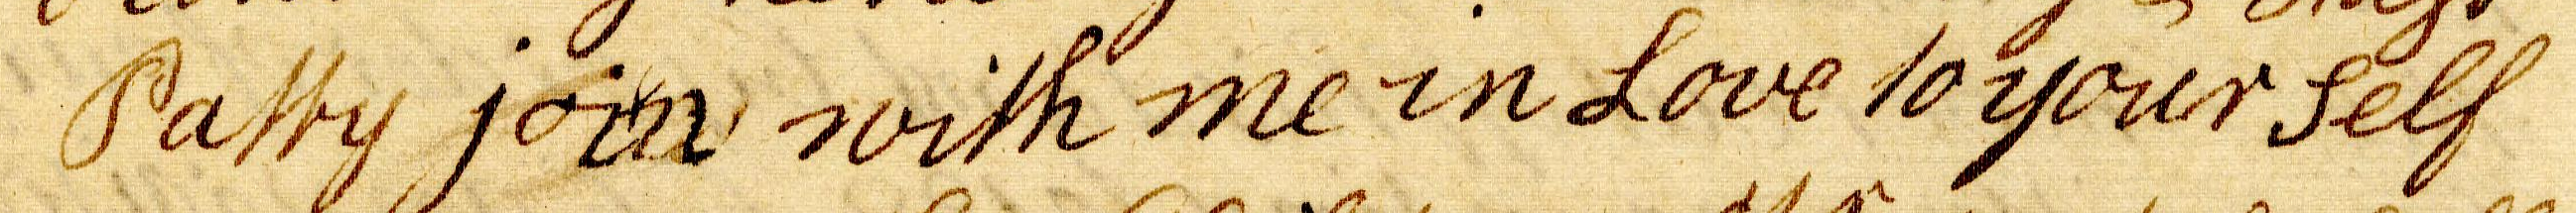Patty join with me in Love to your Self
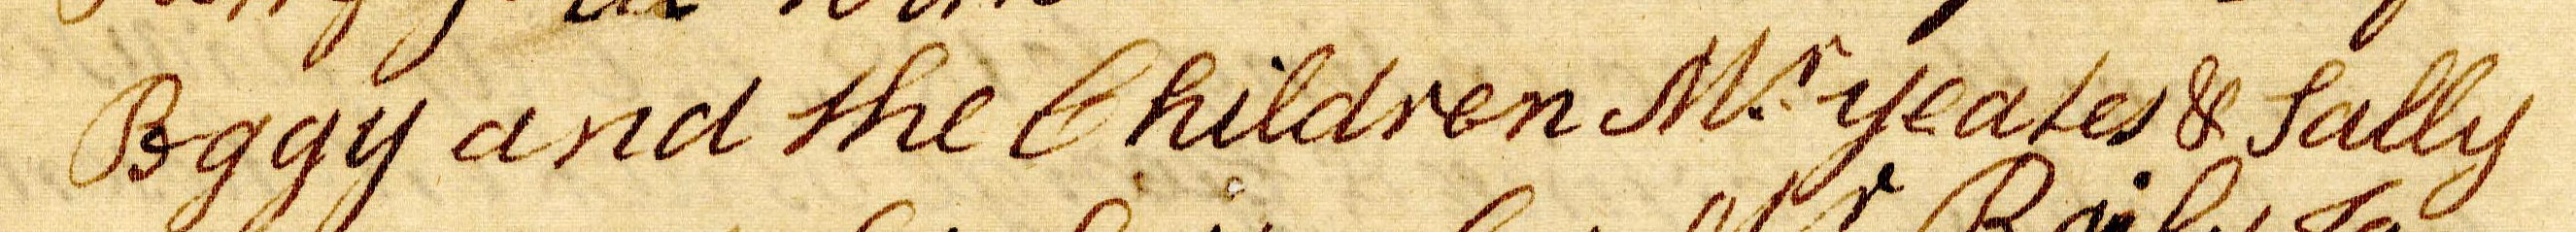Peggy and the Children M^r. Yeates & Sally
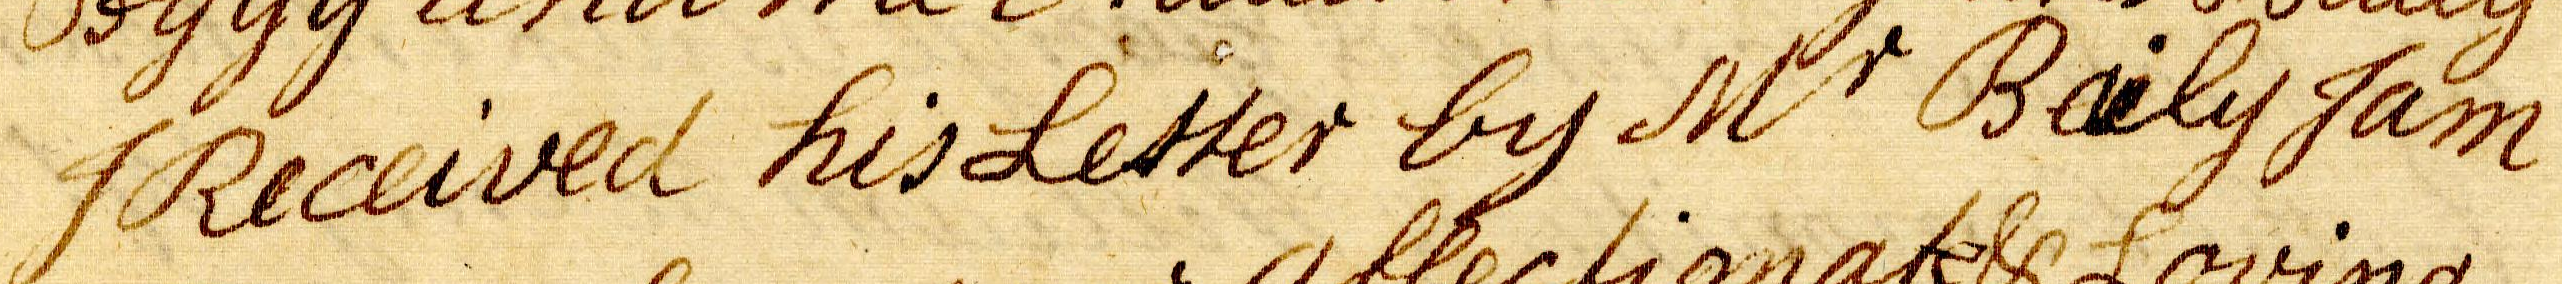I received his Letter by M^r Baily Iam
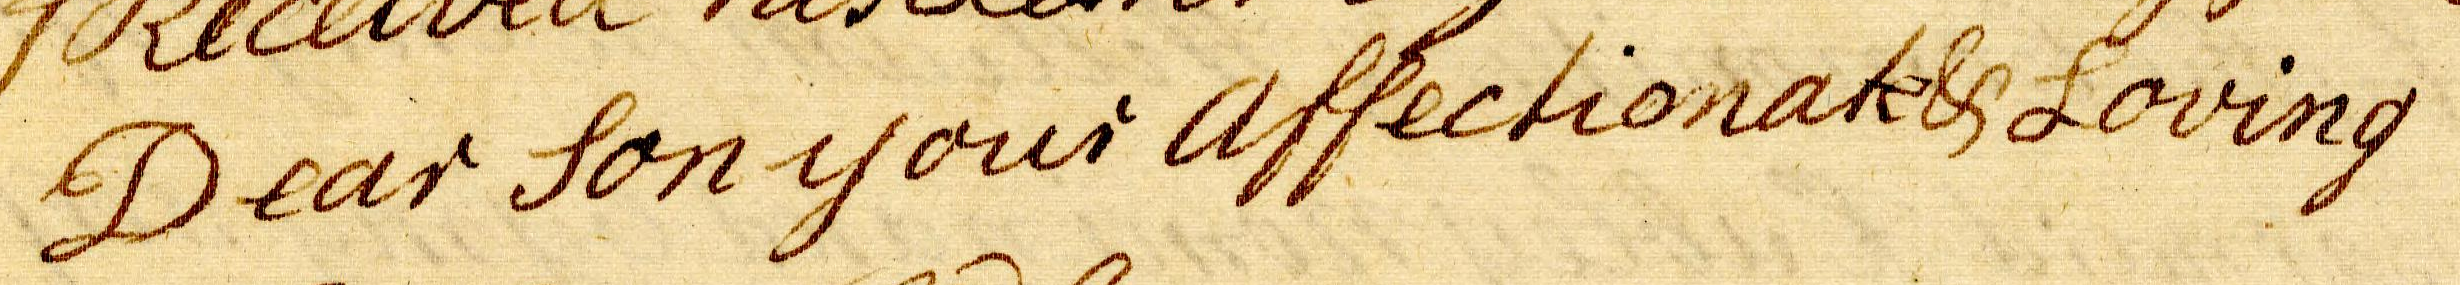Dear Son your Affectionate & Loving
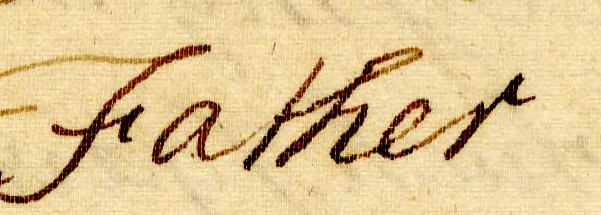Father
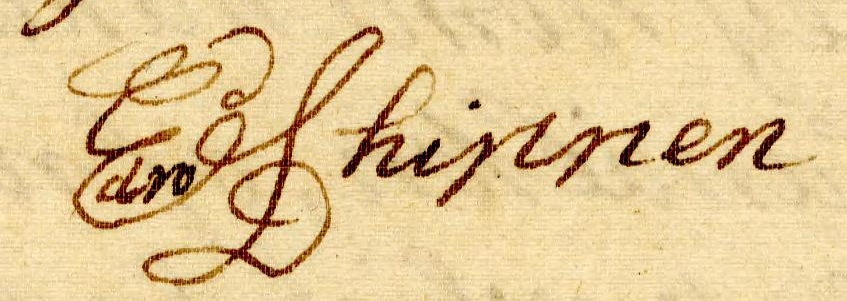Edw^d Shippen
